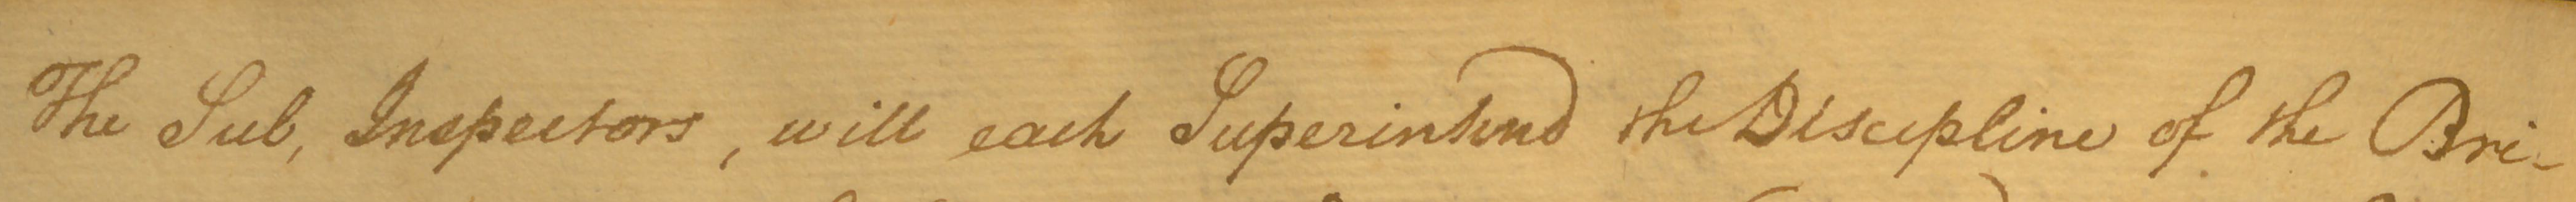The Sub, Inspectors, will each Superintend the Discipline of the Bri-
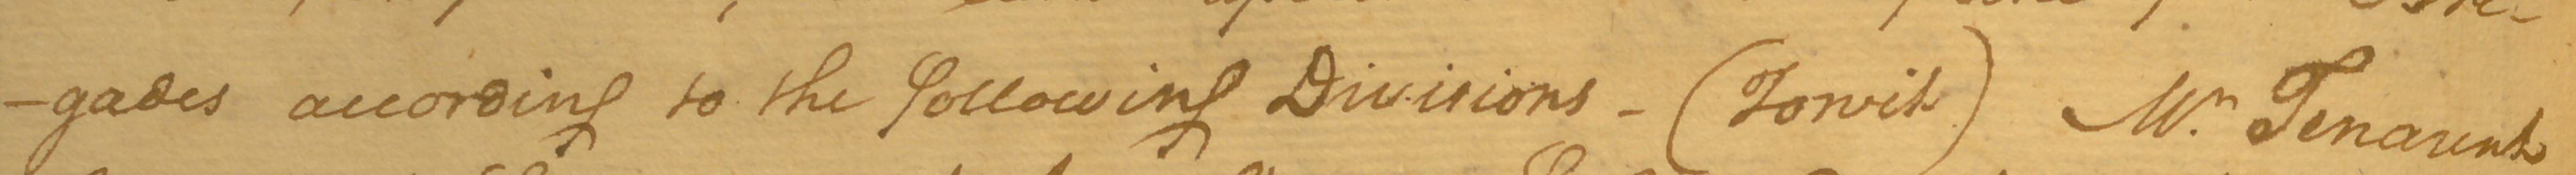-gades according to the following Divisions- (To wit) M^r. Tenarent
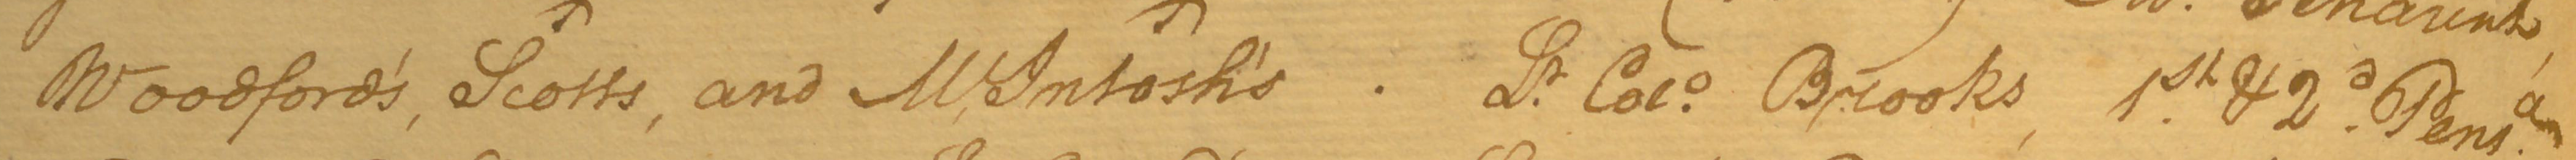Woodford's, Scoots, and M^cIntosh's. L^t. Col^o. Brooks 1^st. & 2^d. Pens^a.
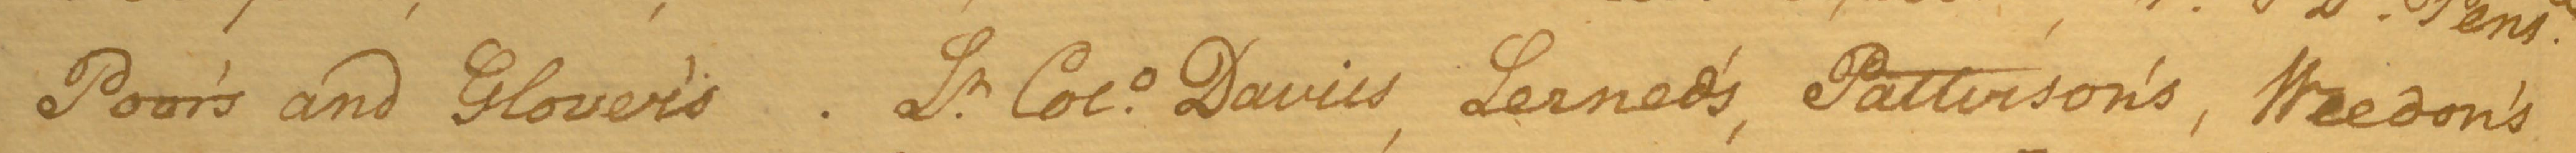Poor's and Glover's. L^t. Col^o. Davies, Lerned's, Patterson's, Weedon's
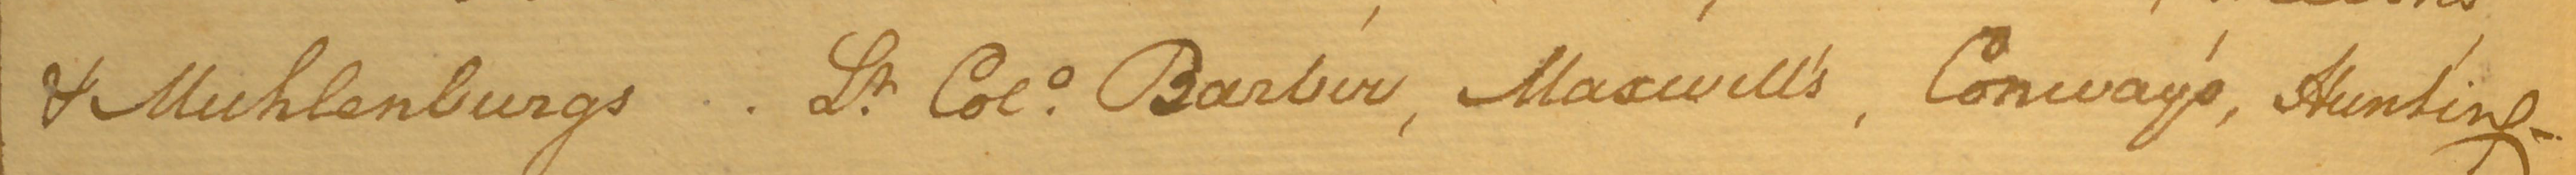& Muhlenburgs. L^t. Col^o. Barber, Maxwell's, Conway's, Hunting-
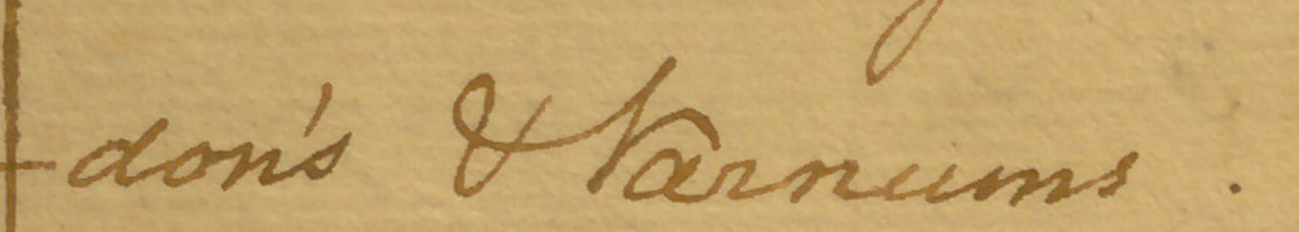-don's & Varnums.
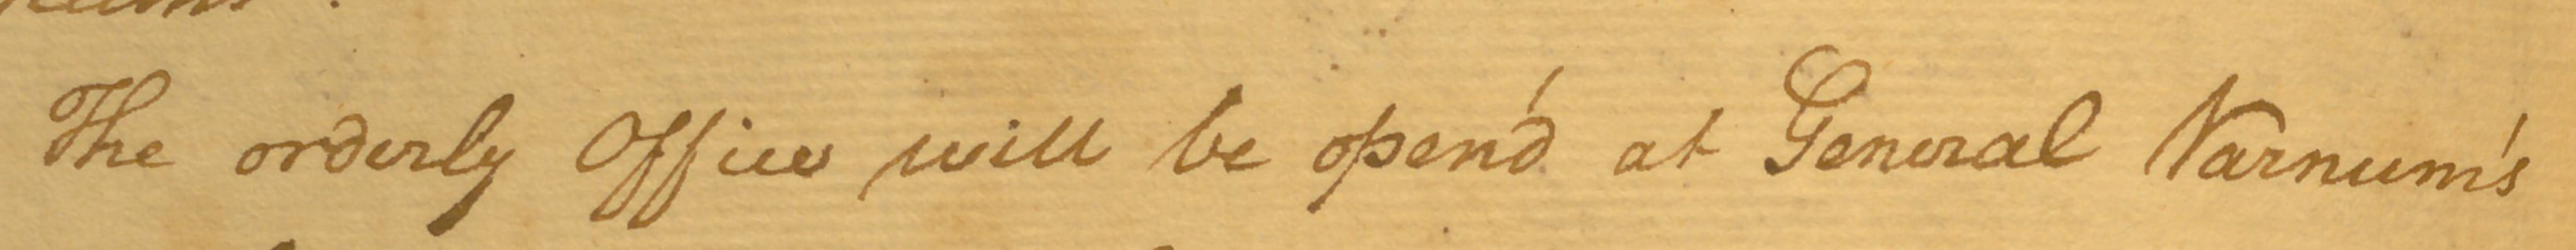The orderly Office will be open'd at General Varnum's
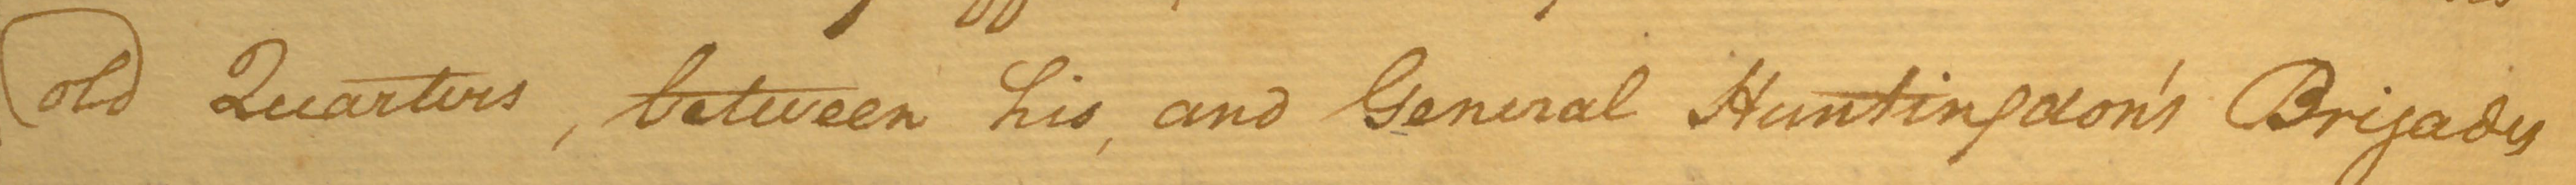old Quarters, between his and General Huntingdon's Brigades
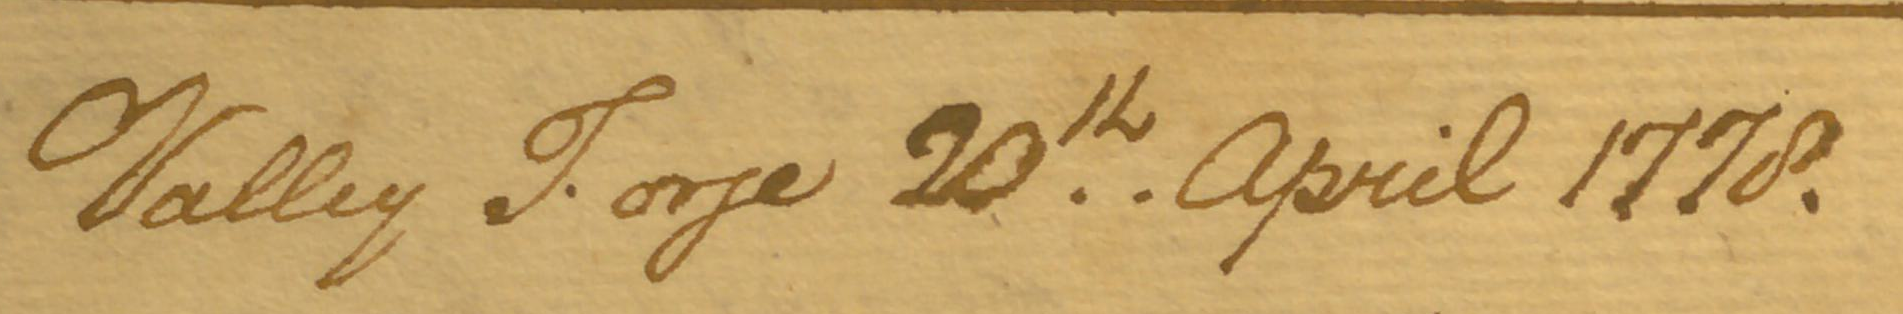Valley Forge 20^th. April 1778.
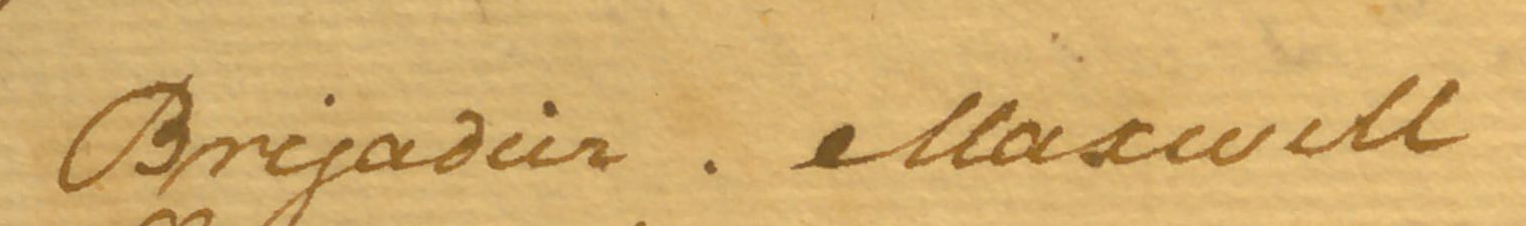Brigadier. Maxwell
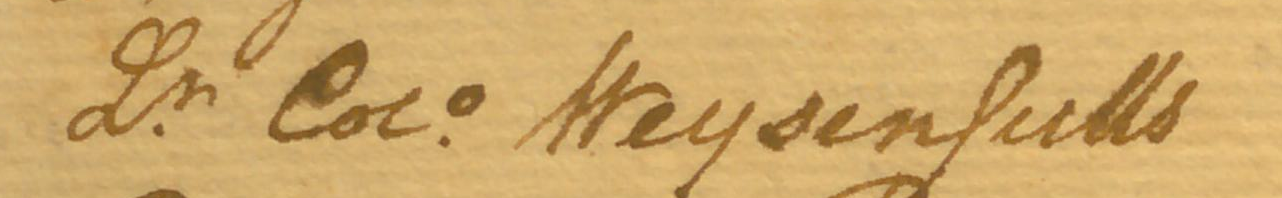L^t. Col^o. Weysenfulls
